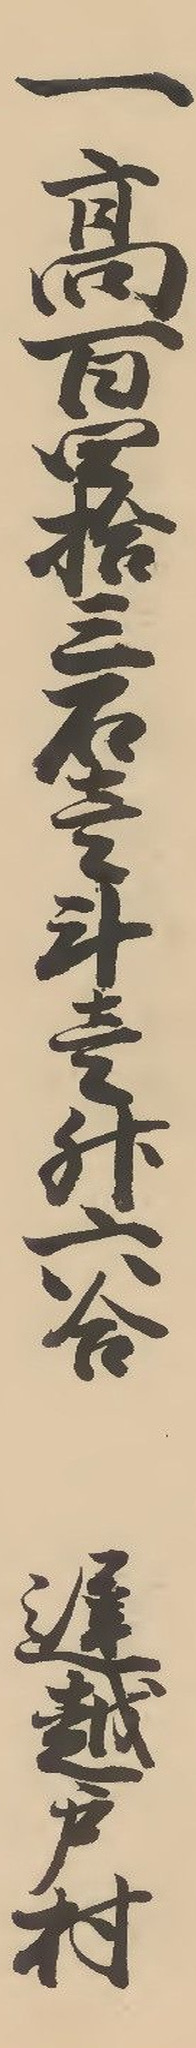一高百四拾三石壱斗壱升六合遅越戸村
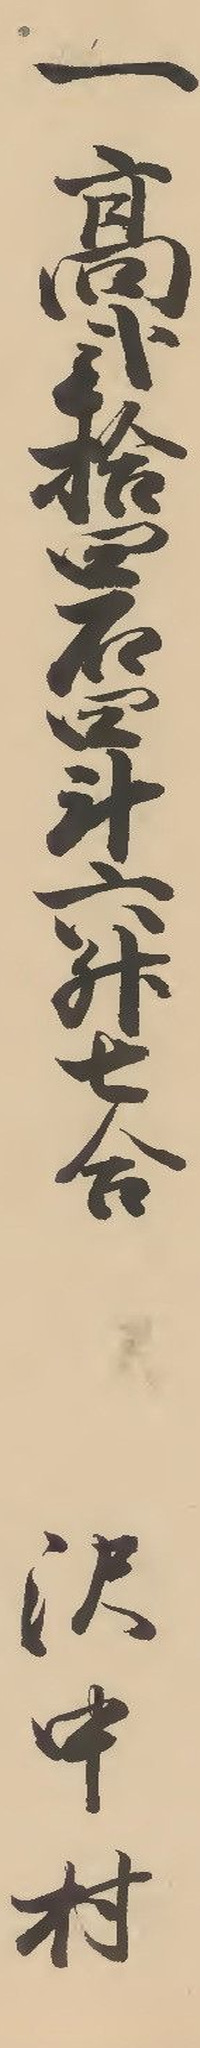一高弐拾四石四斗六升七合沢中村
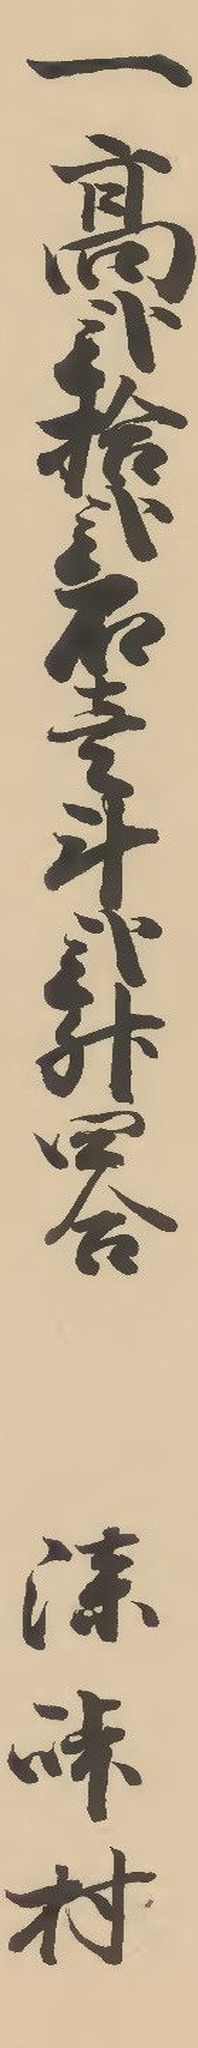一高弐拾弐石壱斗弐升四合漆峠村
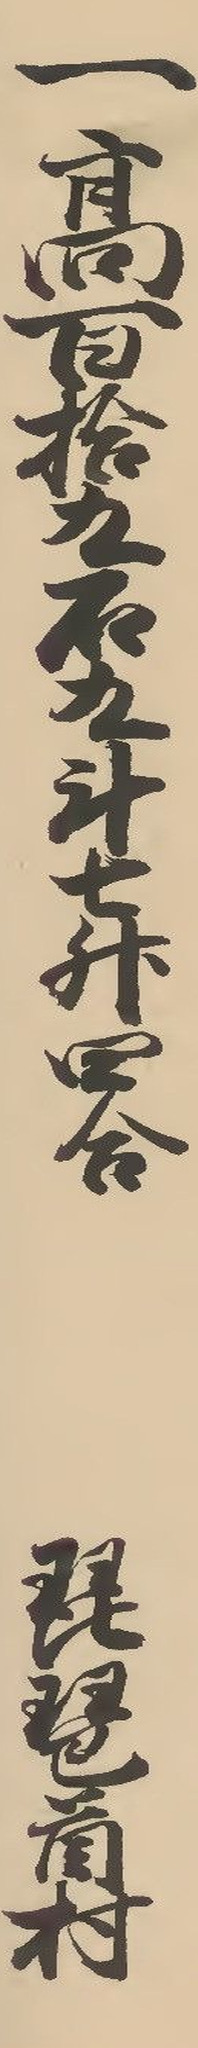一高百拾九石九斗七升四合琵琶首村
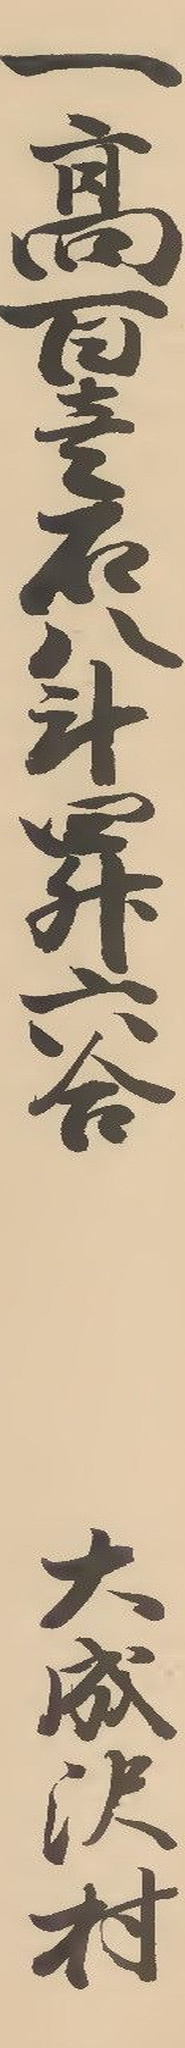一高百壱石八斗四升六合大成沢村
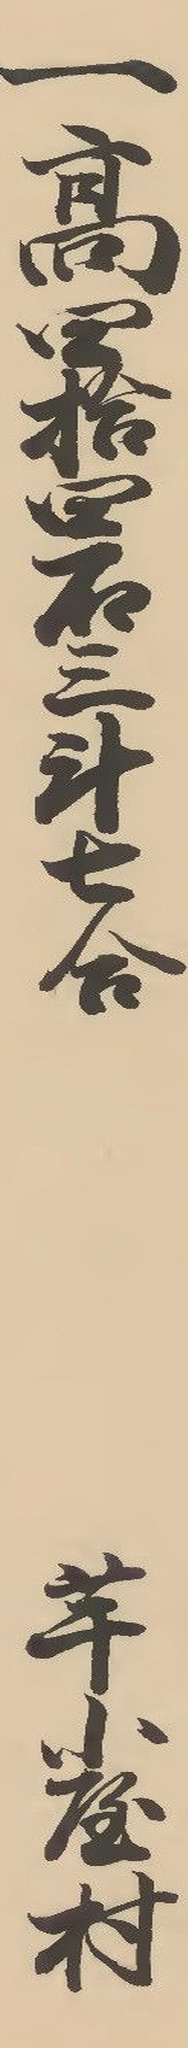一高四拾四石三斗七合芋小屋村
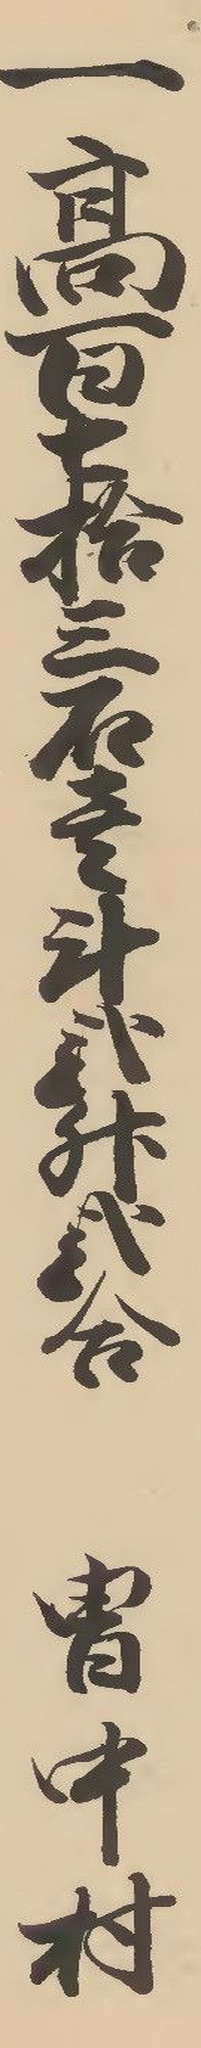一高百七拾三石壱斗弐升弐合胄中村
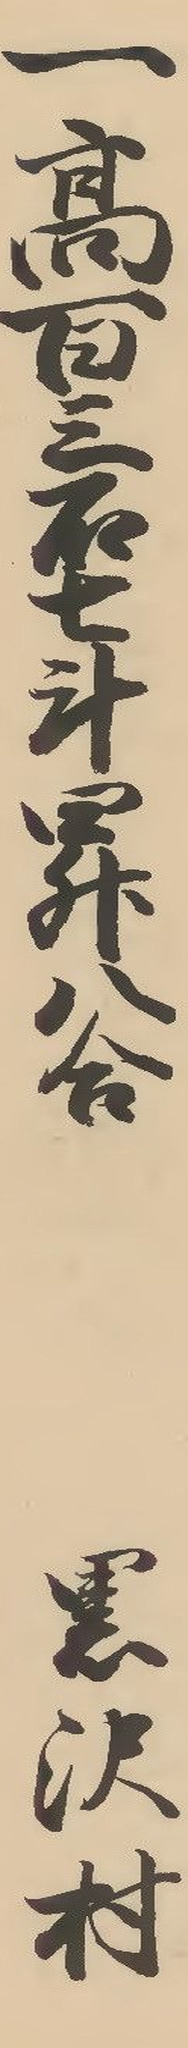一高百三石七斗四升八合黒沢村

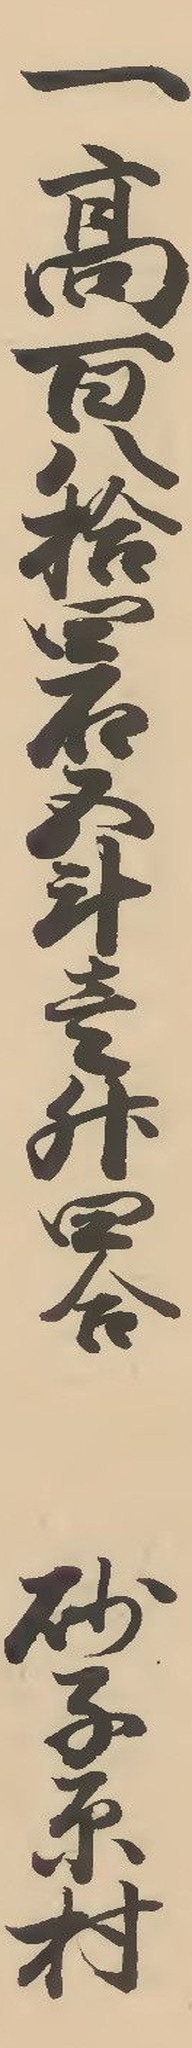一高百八拾四石五斗壱升四合砂子原村
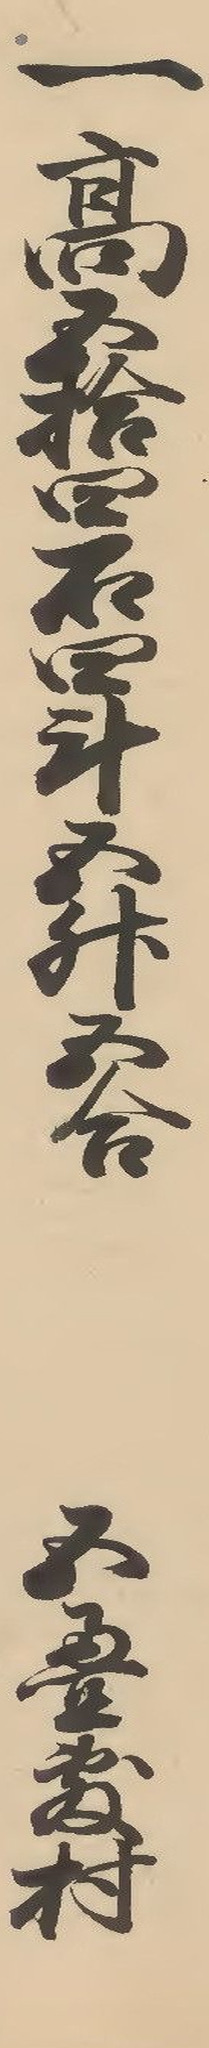一高五拾四石四斗五升五合五畳敷村
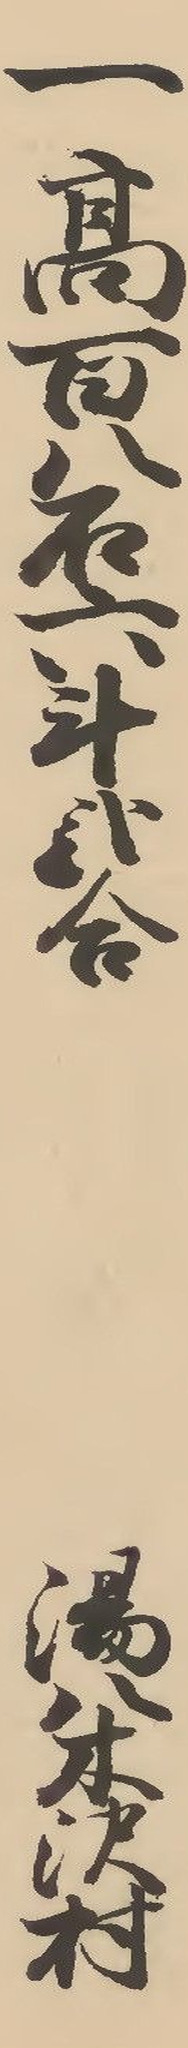一高百八石六斗弐合湯八木沢村
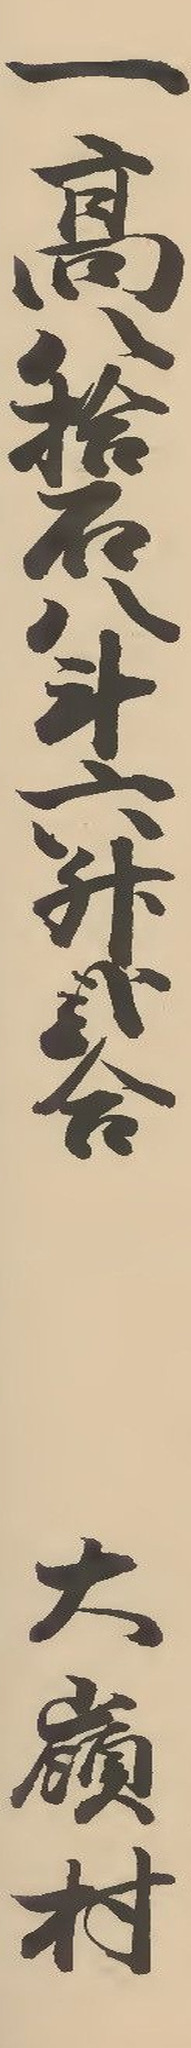一高八拾石八斗六升弐合大嶺村
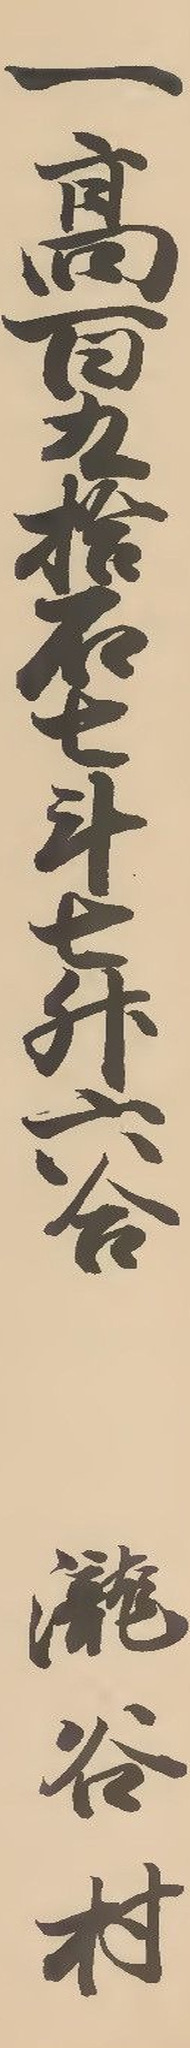一高百九拾石七斗七升六合滝谷村
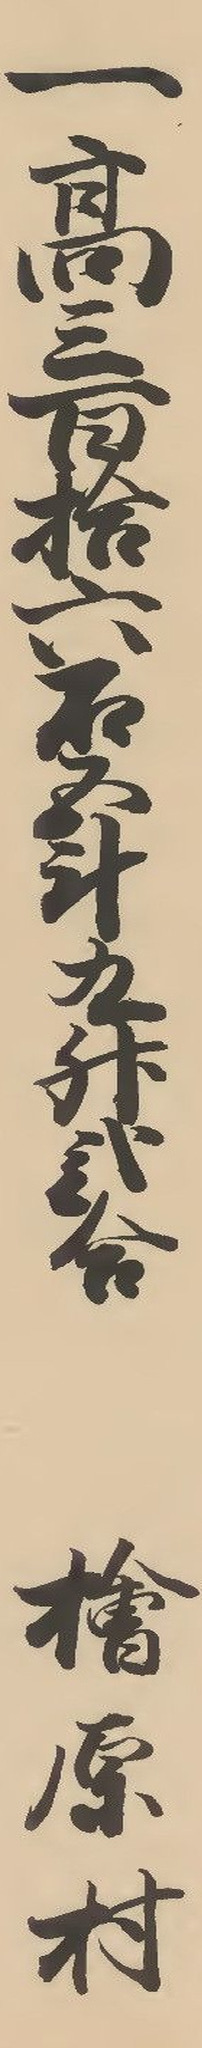一高三百拾六石五斗九升弐合桧原村
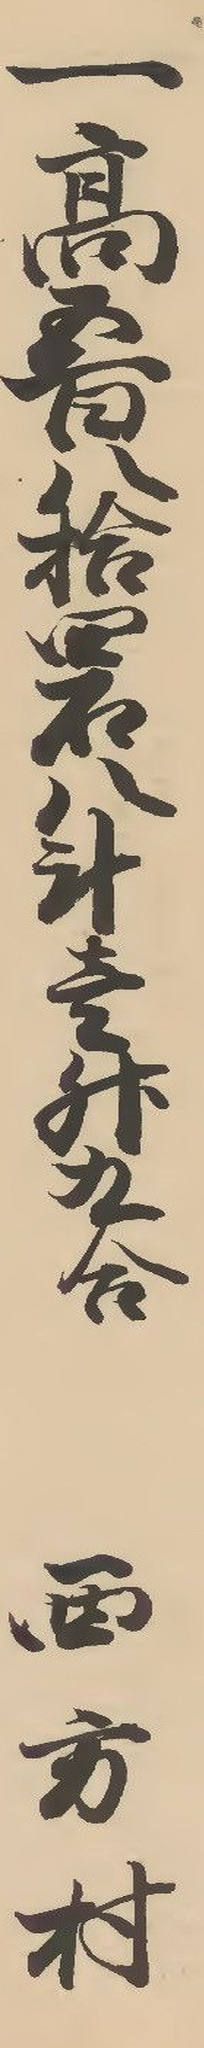一高五百八拾四石八斗壱升九合西方村
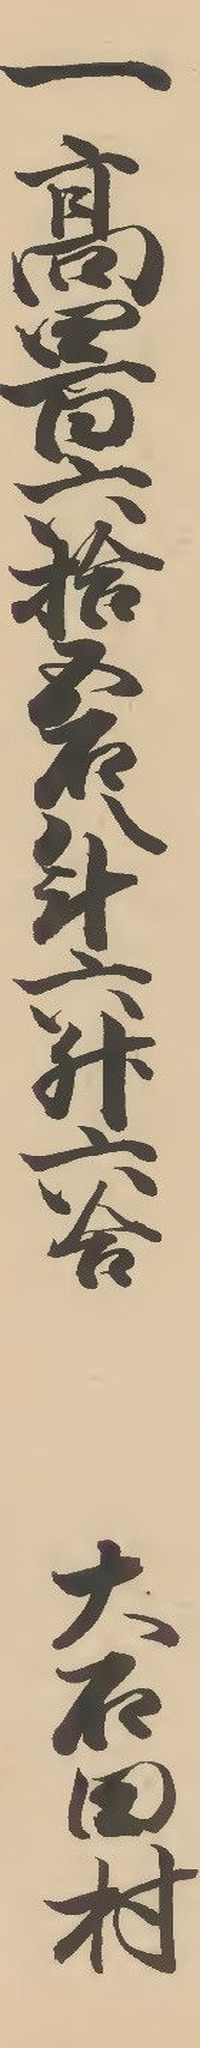一高四百六拾五石八斗六升六合大石田村
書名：陸奥国郷帳　１
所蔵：国立公文書館 National Archives of Japan
